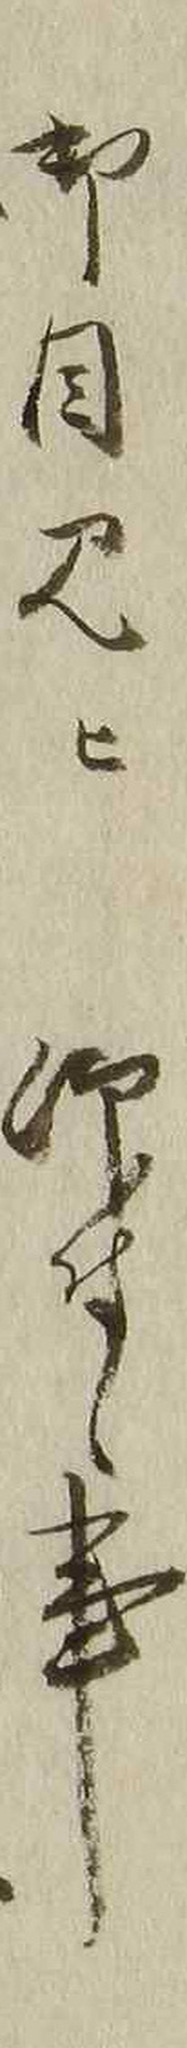御目見被仰付候事
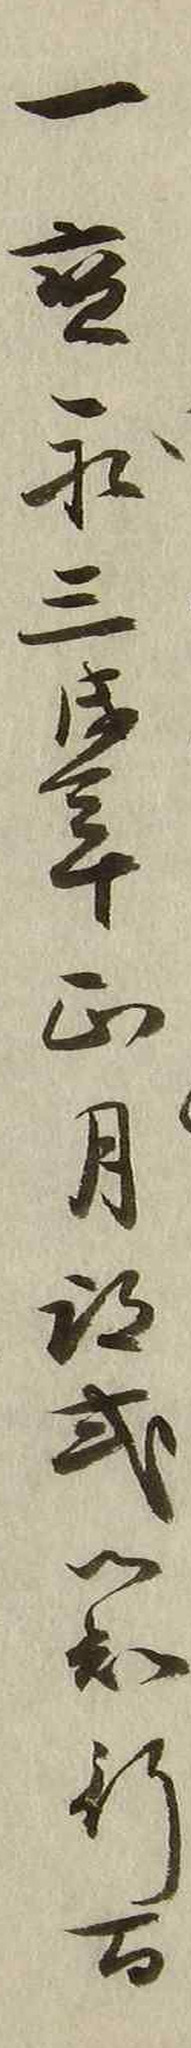一宝永三戌年正月跡式御知行百
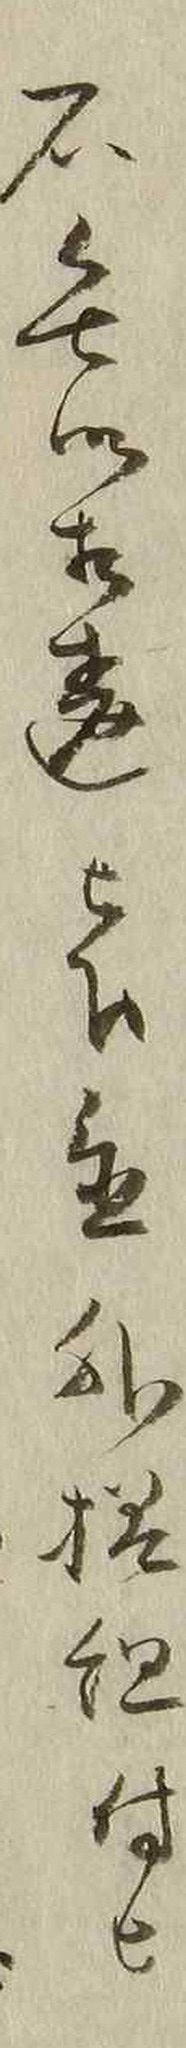石無御相違被下置外様組付被
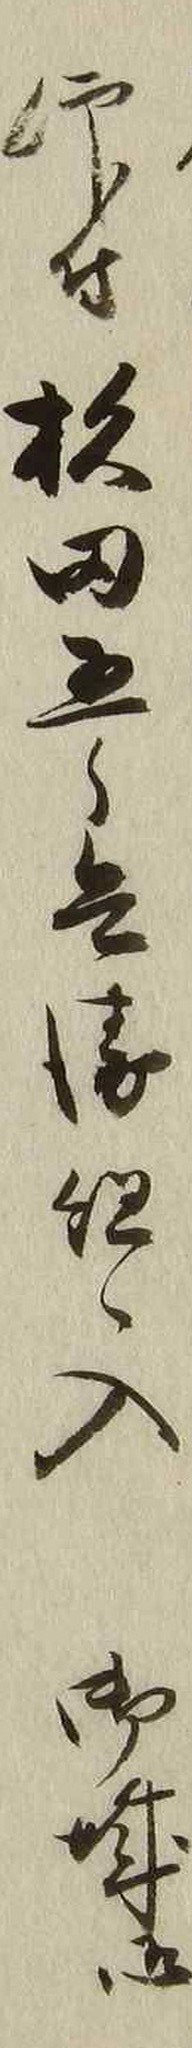仰付杉田五郎兵衛組へ入御城御
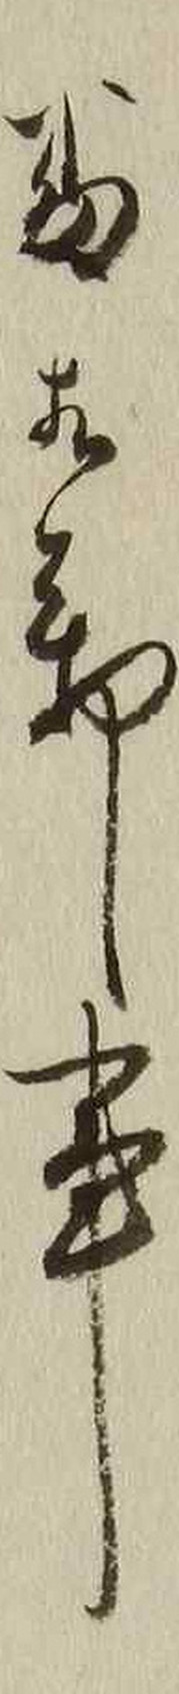番相勤候事
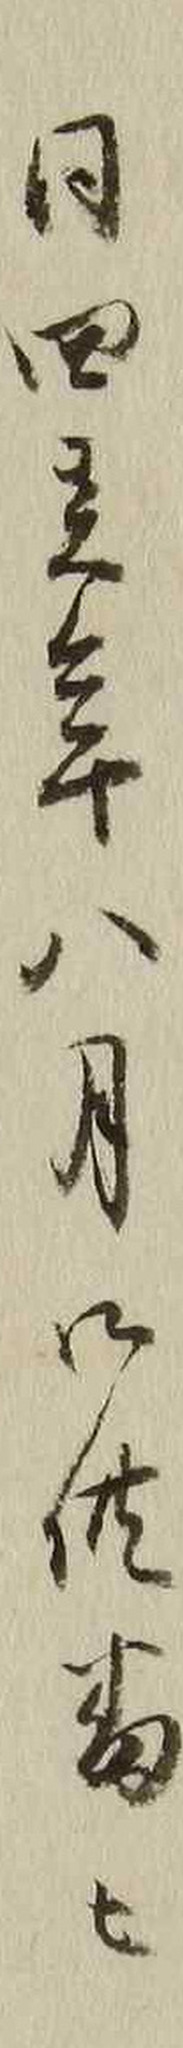一同四亥年八月御供番被
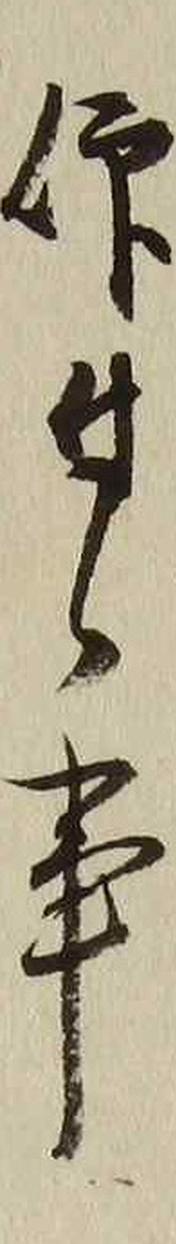仰付候事
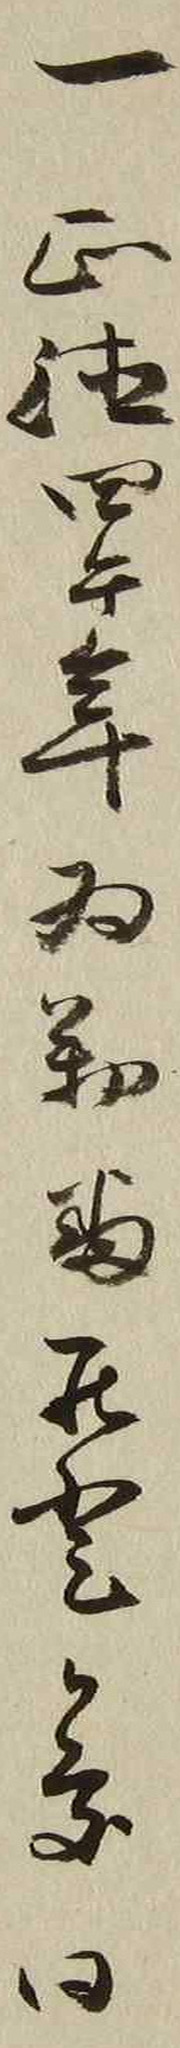一正徳四午年為勤番罷登候処同
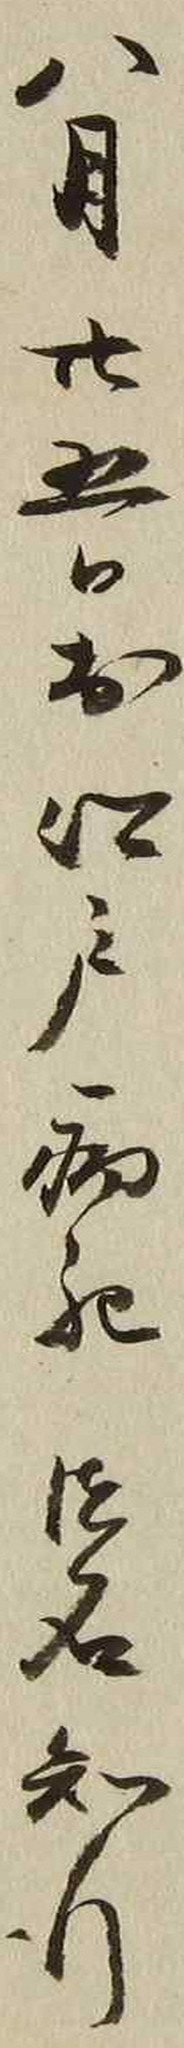八月廿五日於江戸病死法名知行
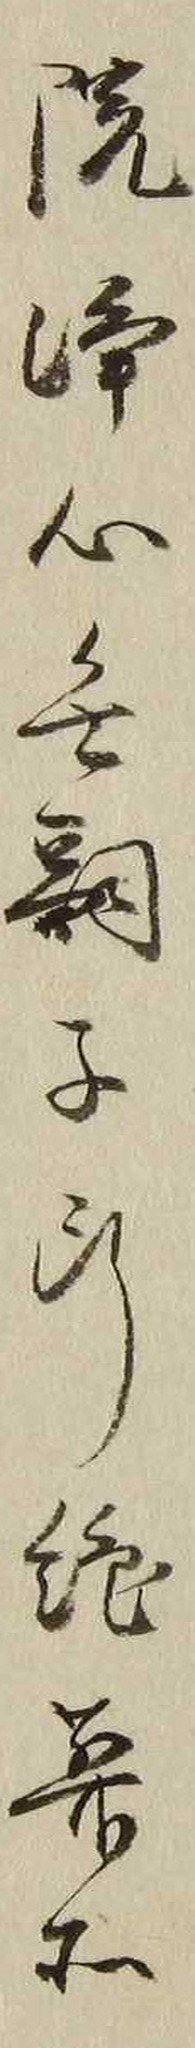院浄心無嗣子断絶葬所
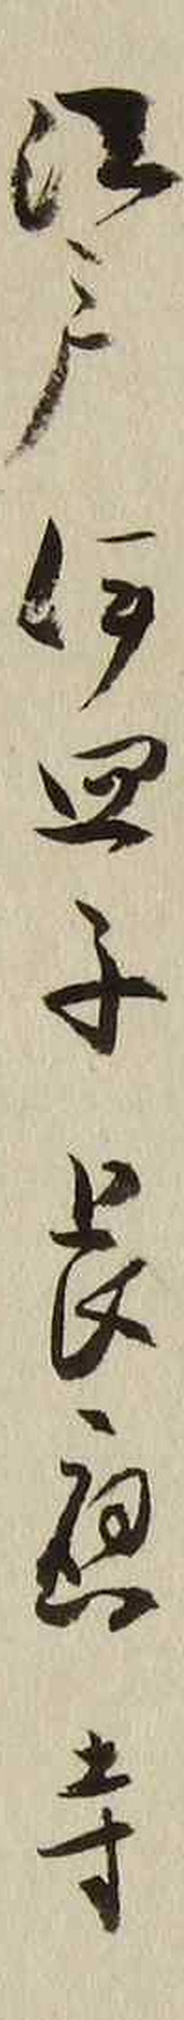江戸伊皿子長応寺
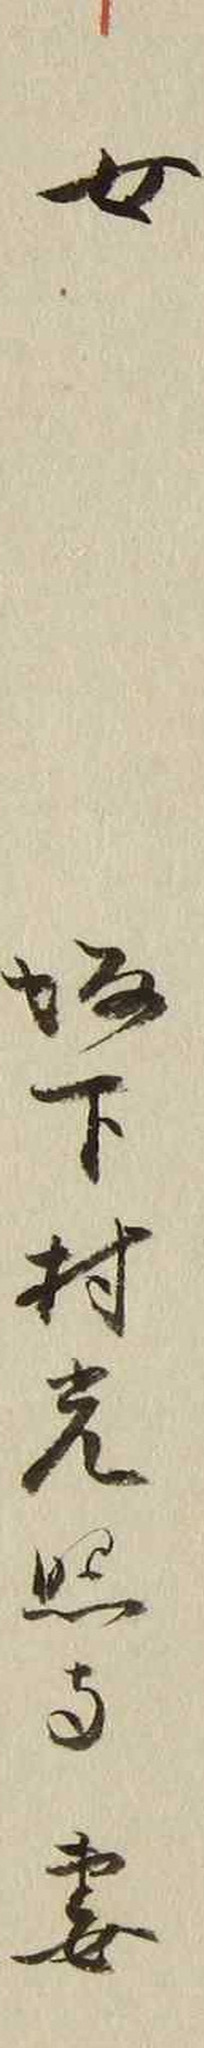女坂下村光照寺妻
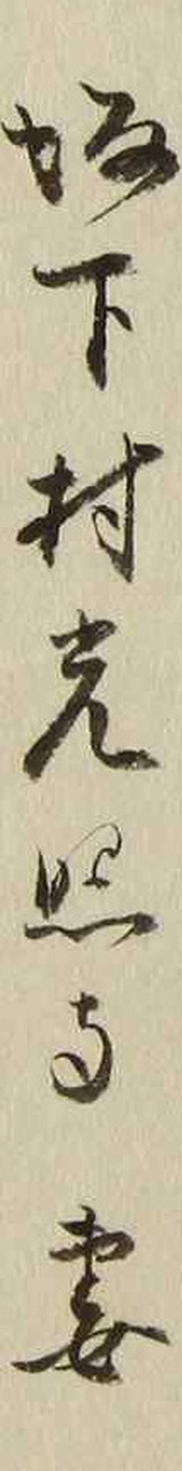女坂下村光照寺妻
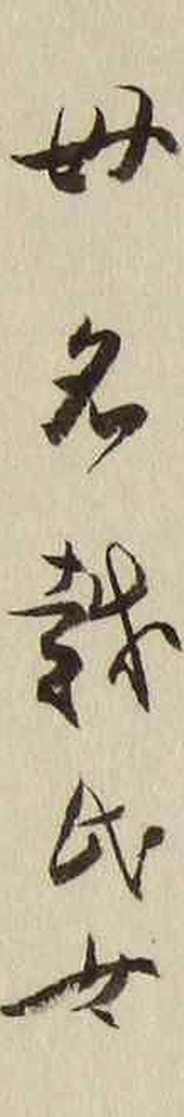母名越氏女

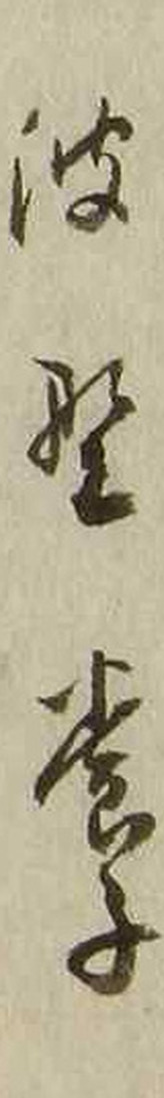波野養子
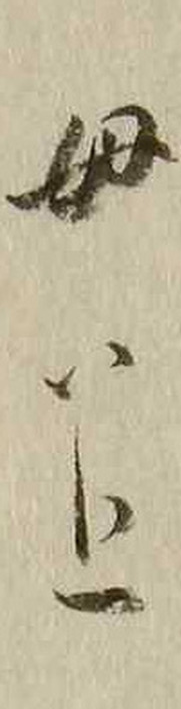母同上
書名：諸士系譜　巻之288　さ之部20
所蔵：会津若松市立会津図書館
